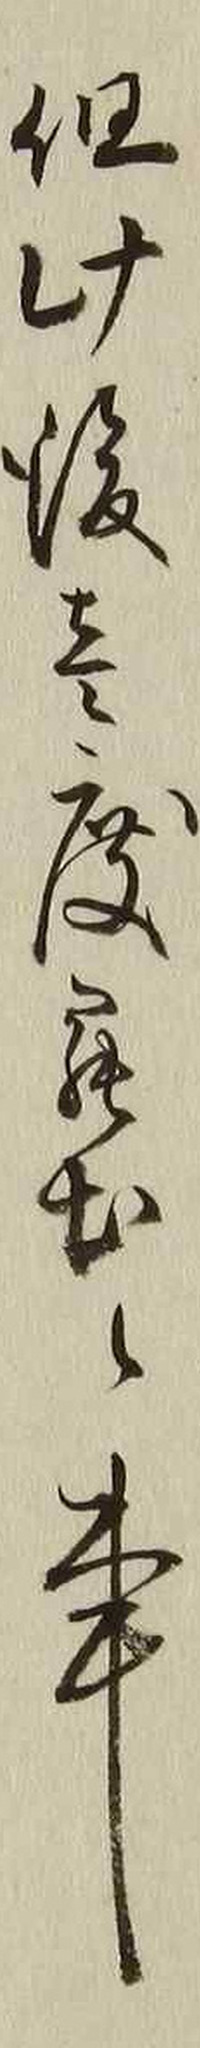但此後壱度罷出候事
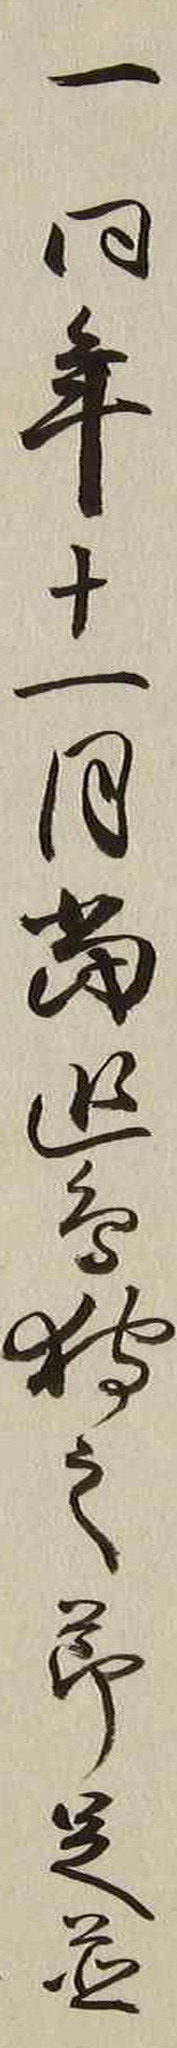一同年十一月当追鳥狩之節足並
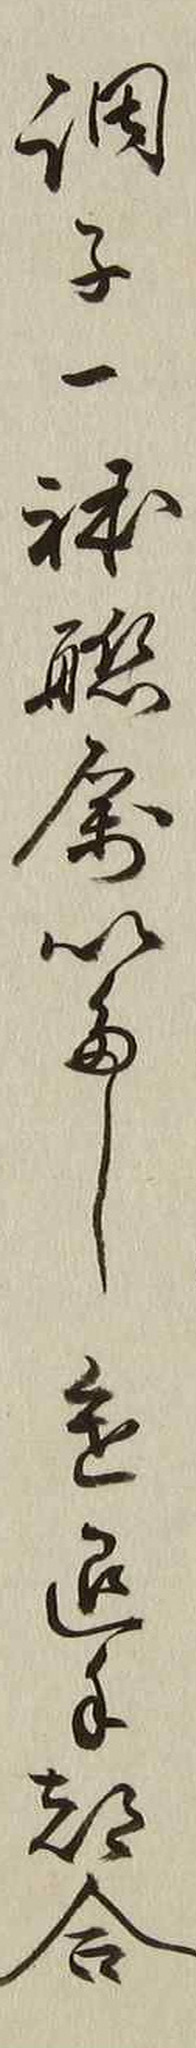調子一体連属いたし進退手都合
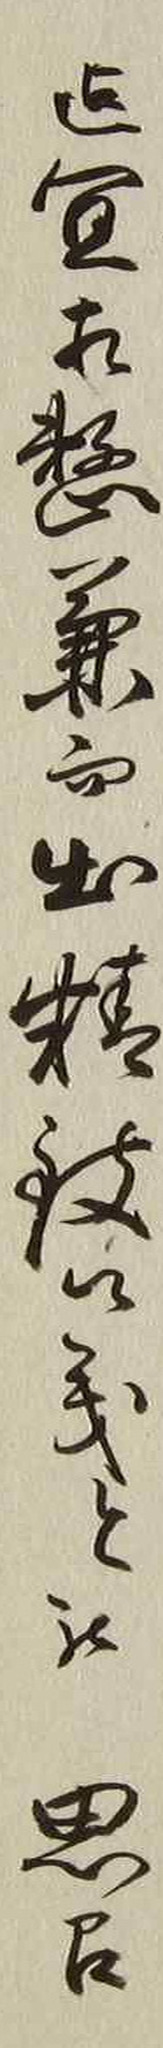迄宜相整兼而出精致候義と被思召
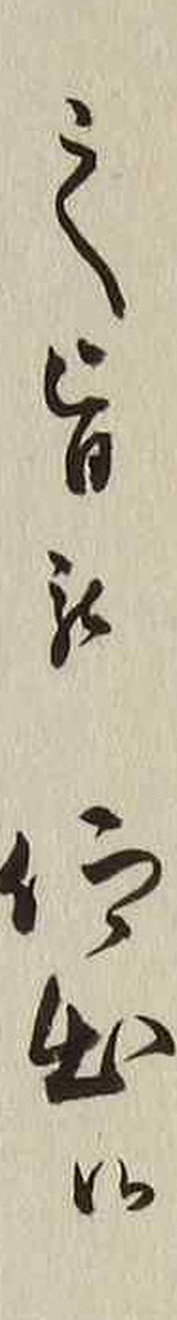之旨被仰出御
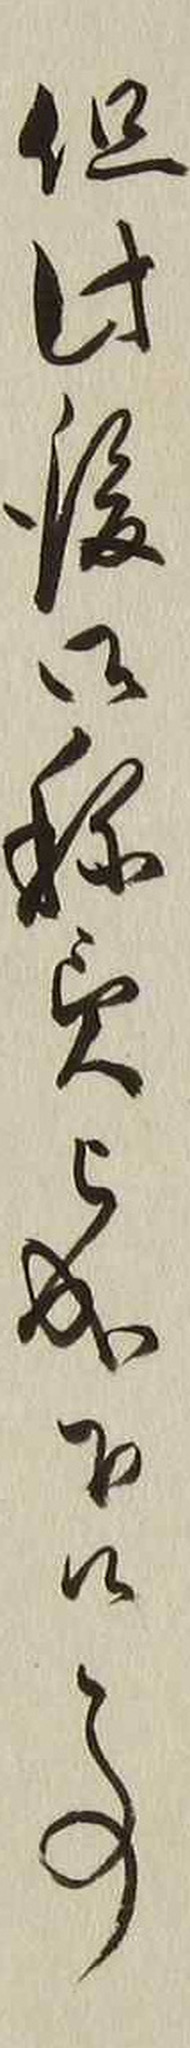但此後御称美被成下候事
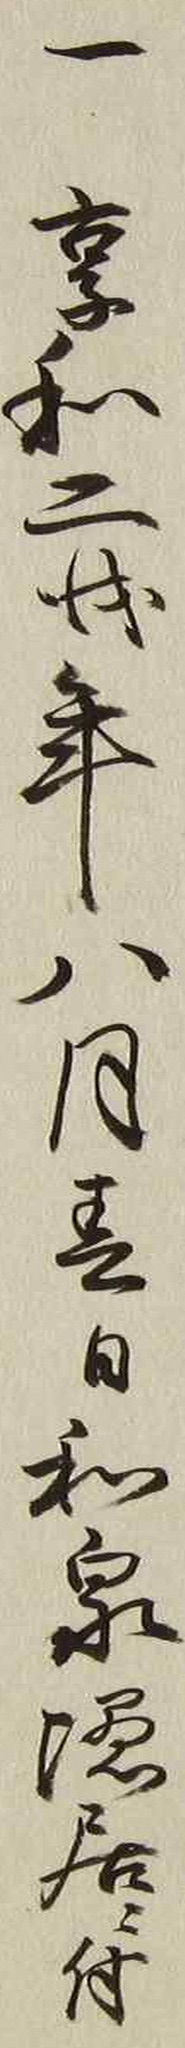一享和二此年八月春日和泉隠居ニ付
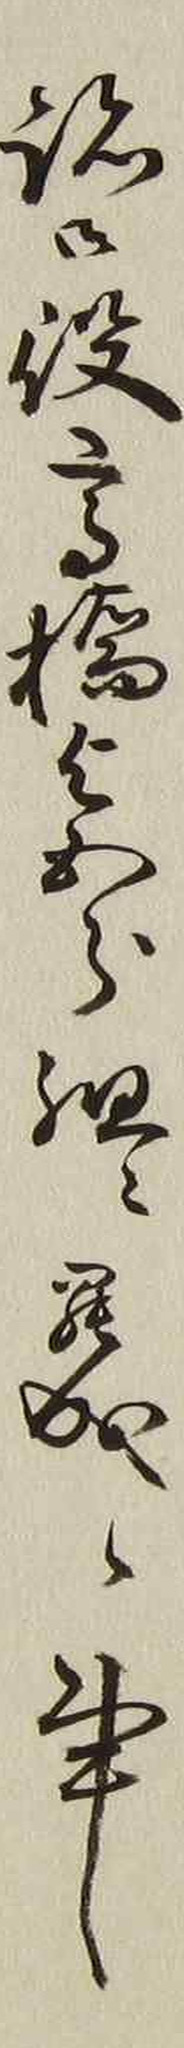跡御役高橋与五郎組ニ罷成候事
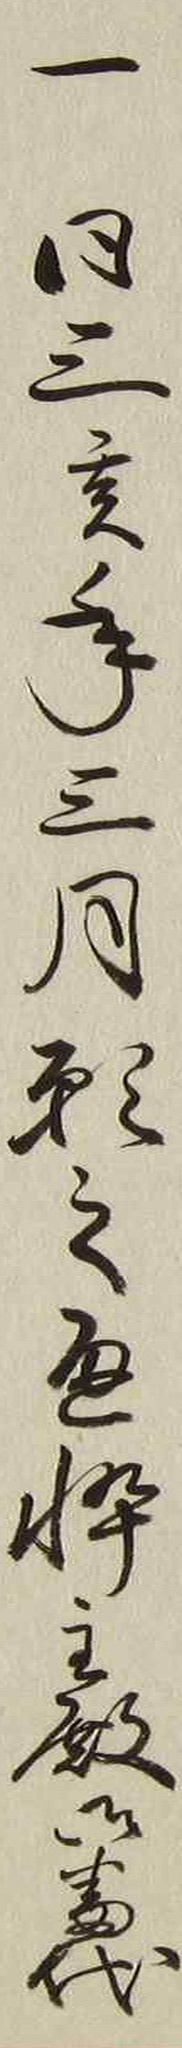一同三亥年三月願之通忰主殿御番代
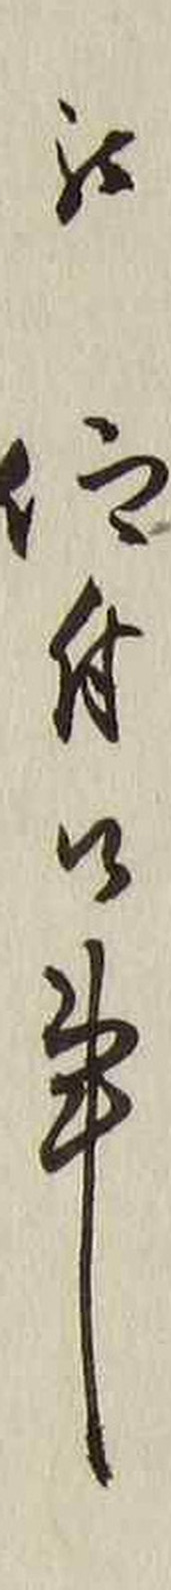被仰付候事
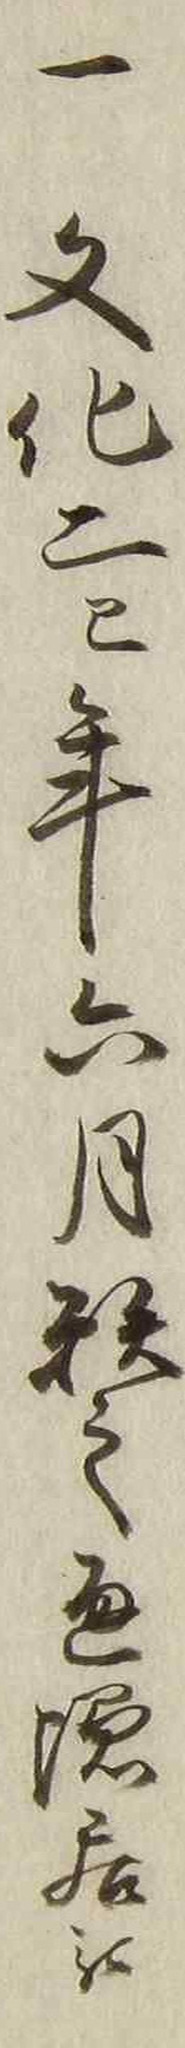一文化二巳年六月願之通隠居被

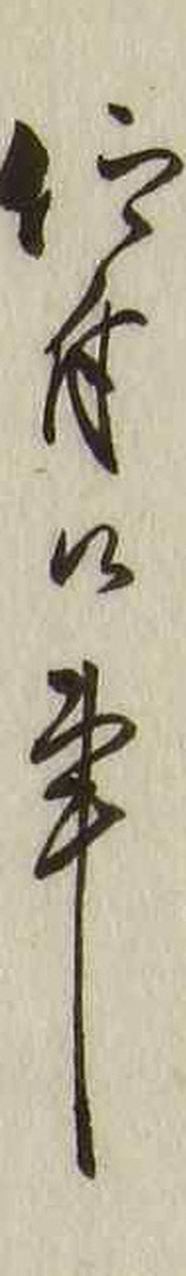仰付候事
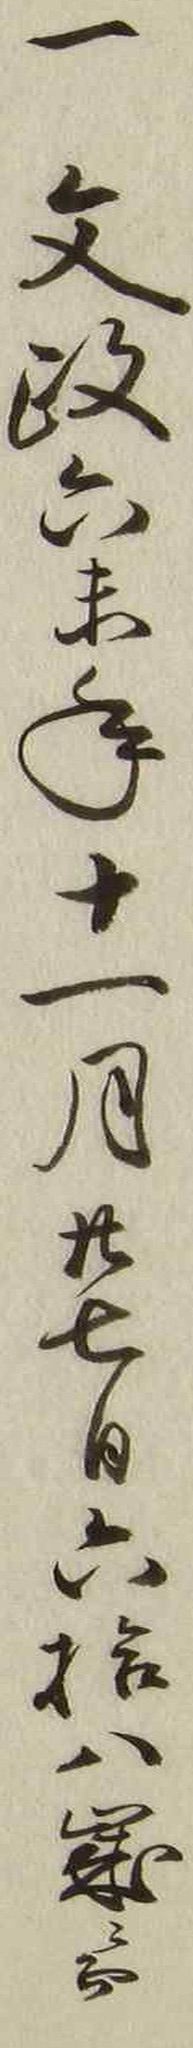一文政六未年十一月廿七日六拾八歳ニ而
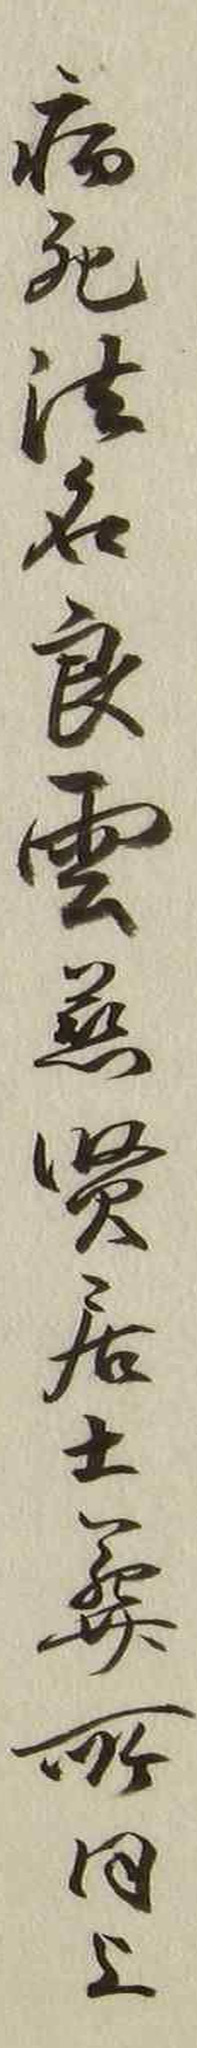病死法名良雲慈賢居士葬所同上
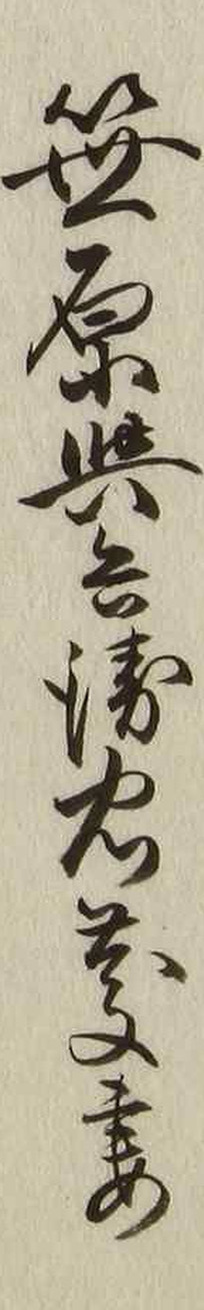女笹原興兵衛忠慶妻
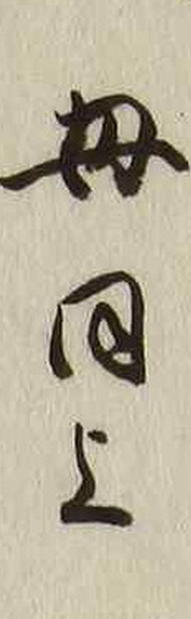母同上
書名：諸士系譜　巻之15　い之部15
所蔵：会津若松市立会津図書館
